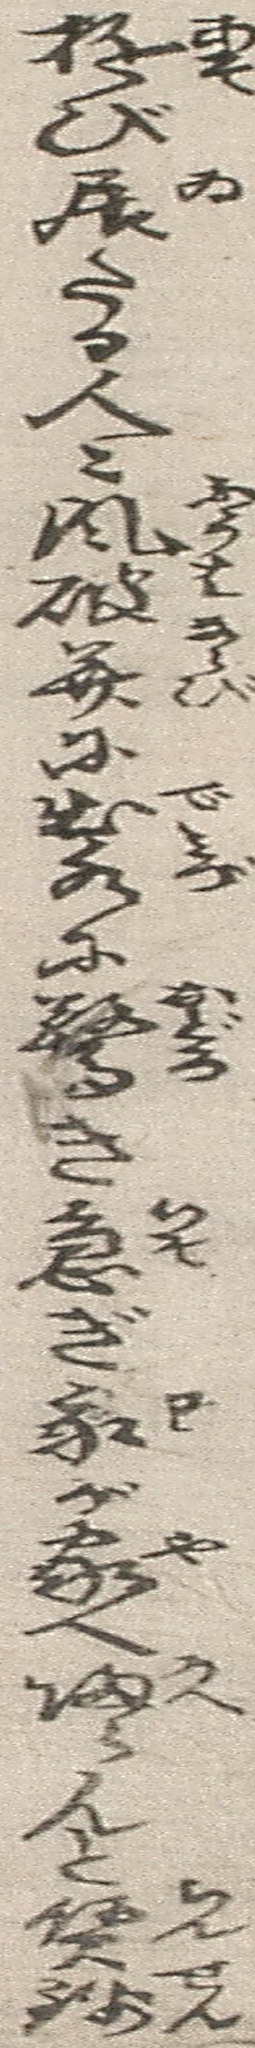遊び居たる人々風破并に出水に驚き急ぎ我が家へ帰らんと賃銭
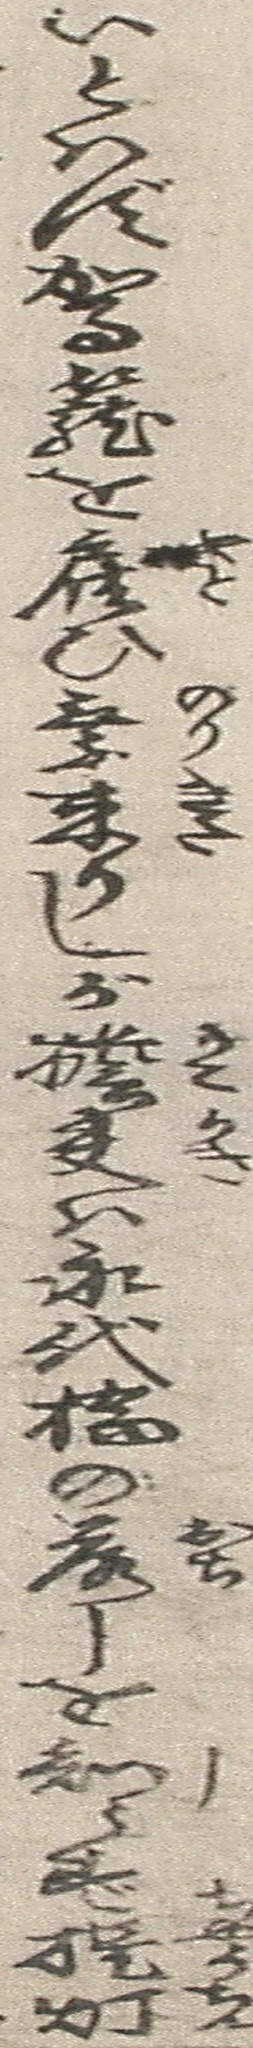いとハず駕籠を雇ひ乗来りしが擔夫ハ永代橋の落しを知らず提灯
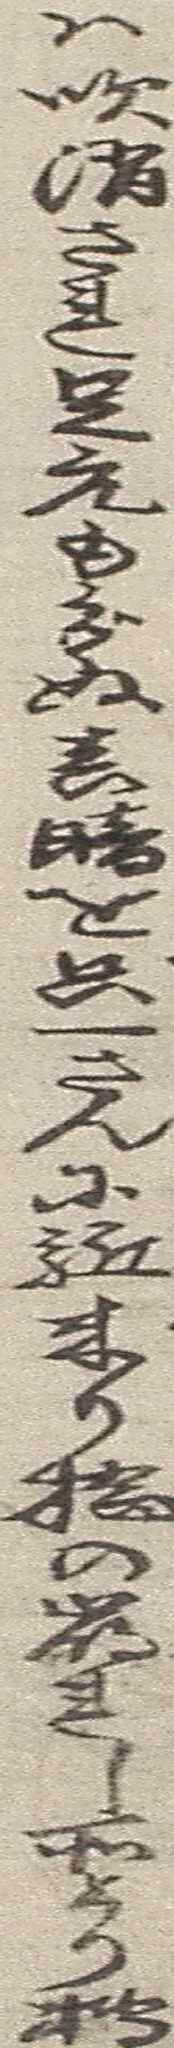ハ吹消され足元も分ぬ真暗を只一さんに駆来り橋の崩れし所より転
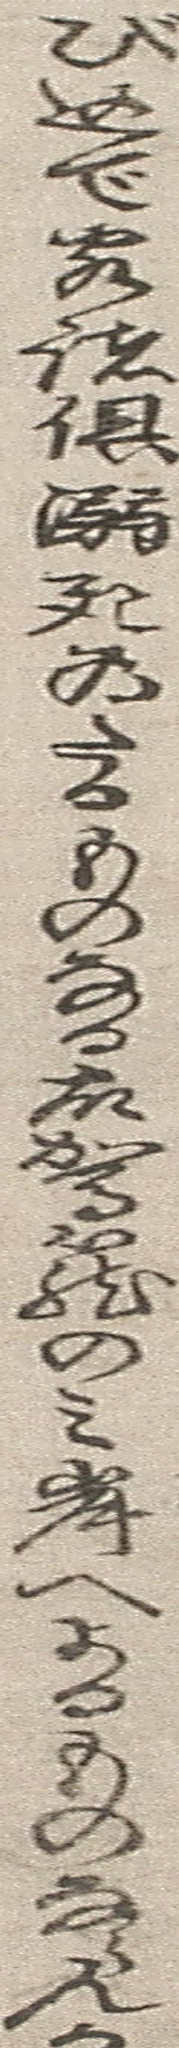び込で客諸倶溺死為たるものなる故駕籠のミ岸へよるものならんか
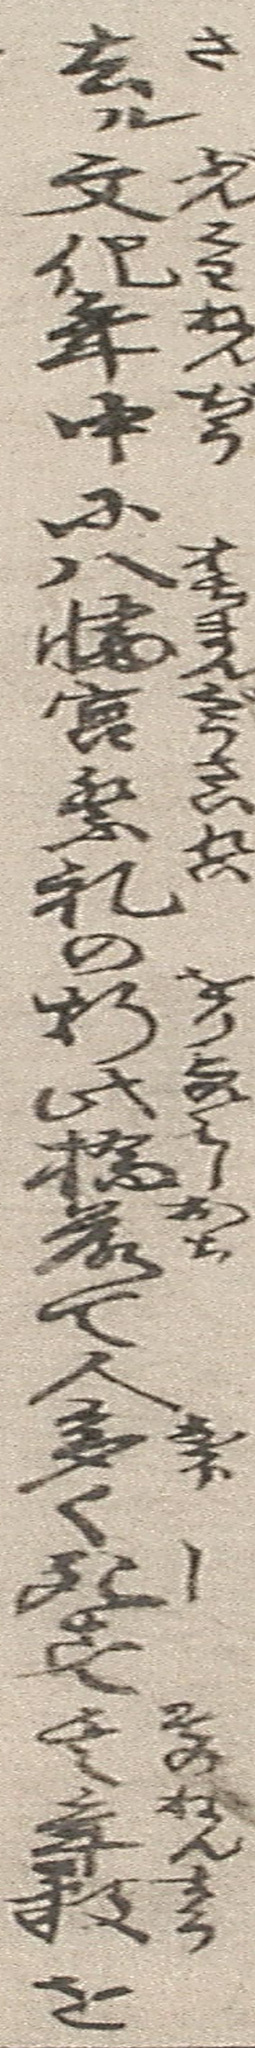去ㇽ文化年中に八幡宮祭礼の折此橋落て人多く死す其年数を
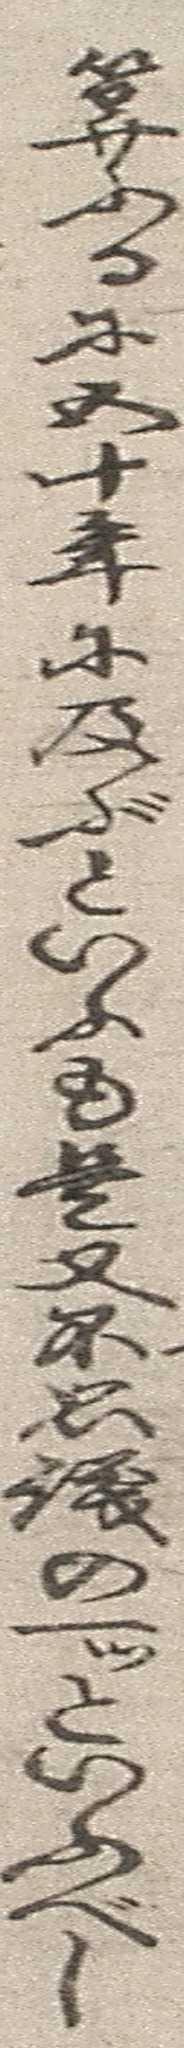算ふるに五十年に及ぶといふも是又不思議の一ッといふべし
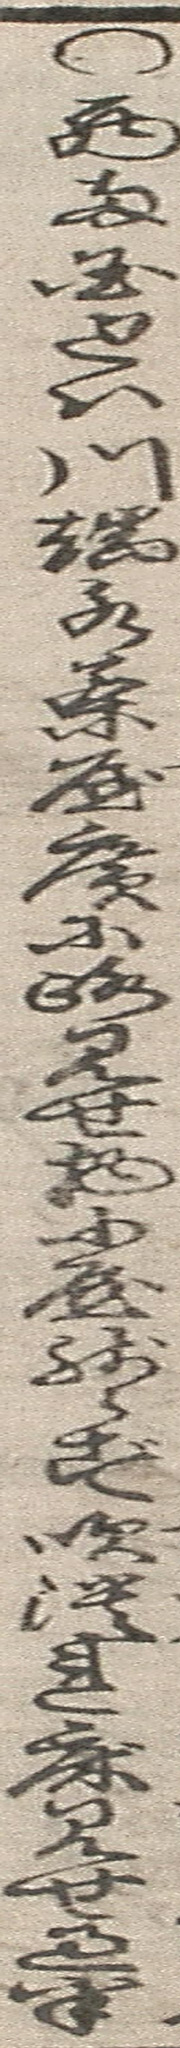◯西両国辺ハ川端水茶屋広小路見せ物小屋残らず吹潰れ床見せ過半
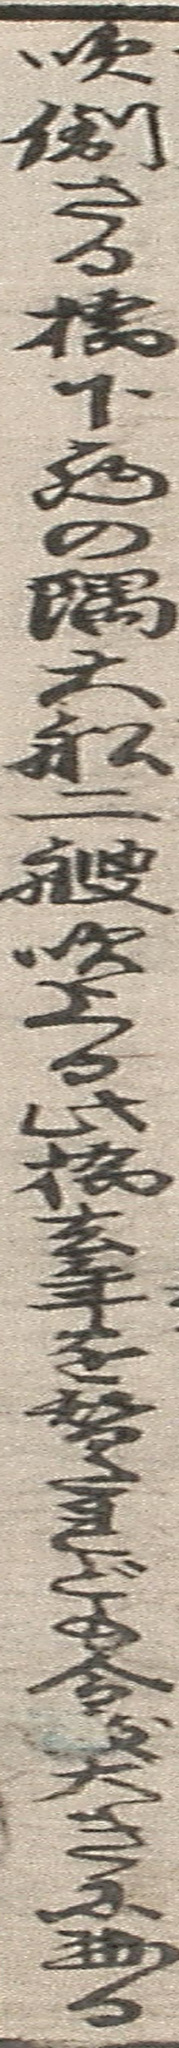吹倒さる橋下西の隅大船二艘吹上る此橋去年懸替たれども今度大きに曲る
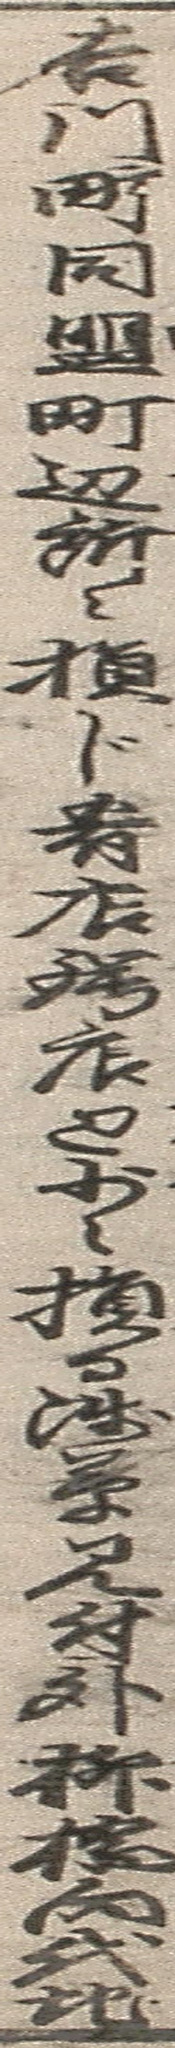吉川町同盟町辺所々損じ肴店鍔店辺少々損る浅草見付外柳橋向代地
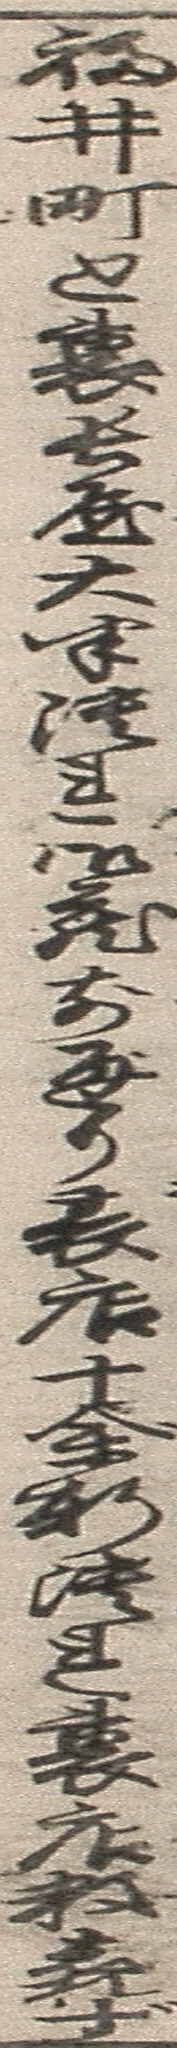福井町辺裏長屋大半潰れ御蔵前通り表店十余軒潰れ裏店数しれず
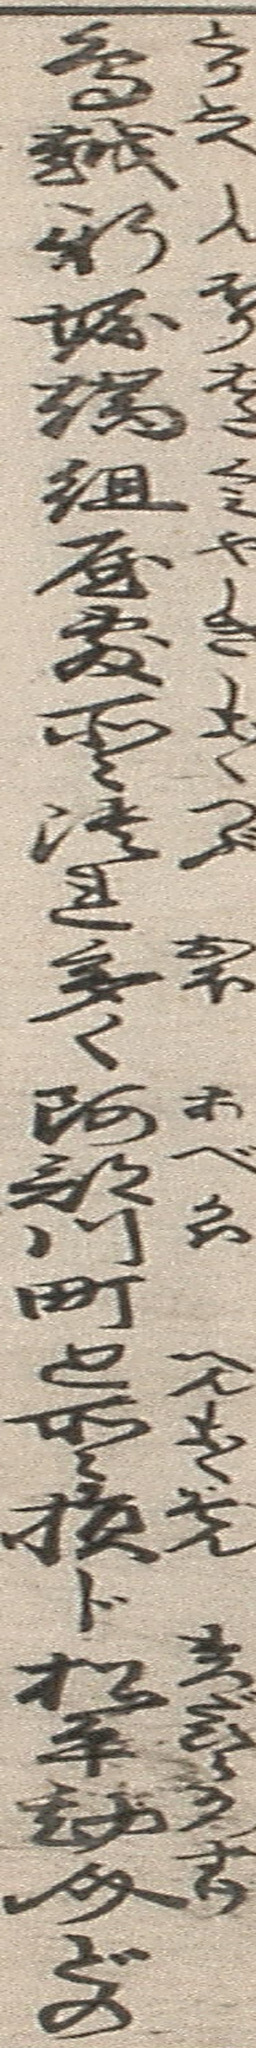鳥越新堀端組屋敷所々潰れ多く阿部川町辺所々損じ松平勘介どの
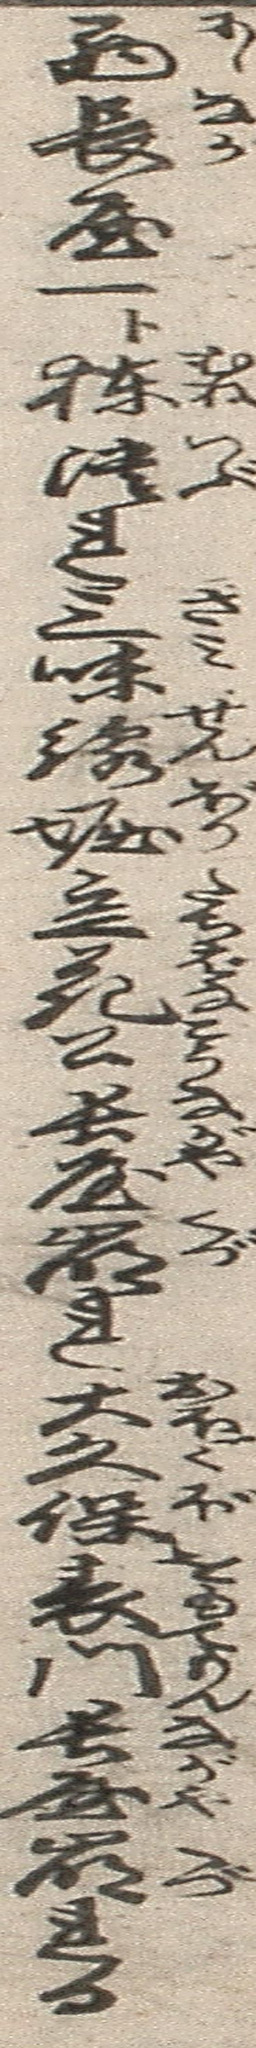西長屋一ト棟潰れ三味線堀立花公長屋潰れ大久保表門長屋崩れる
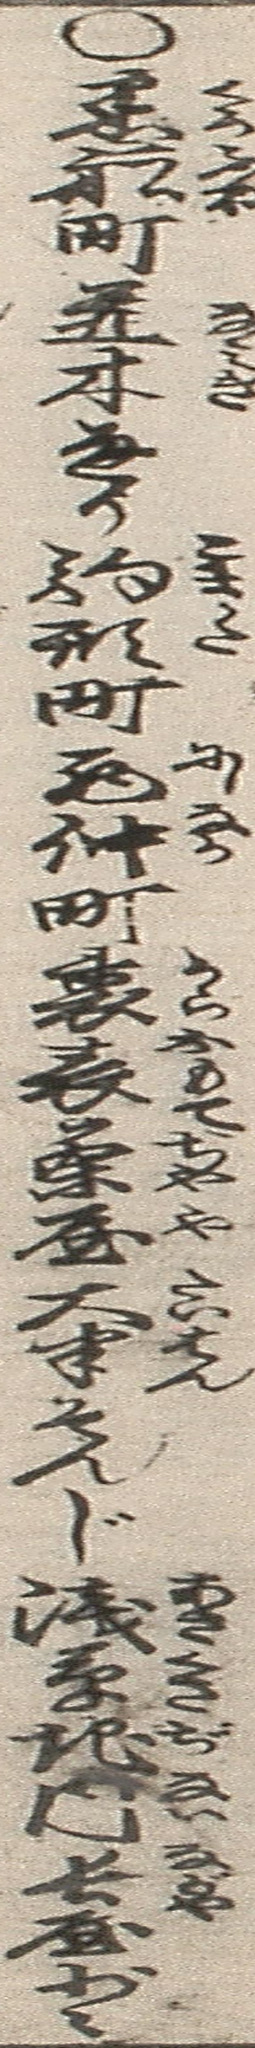◯黒船町並木通り駒形町西仲町裏表茶屋大半そんじ浅草地内長屋少々
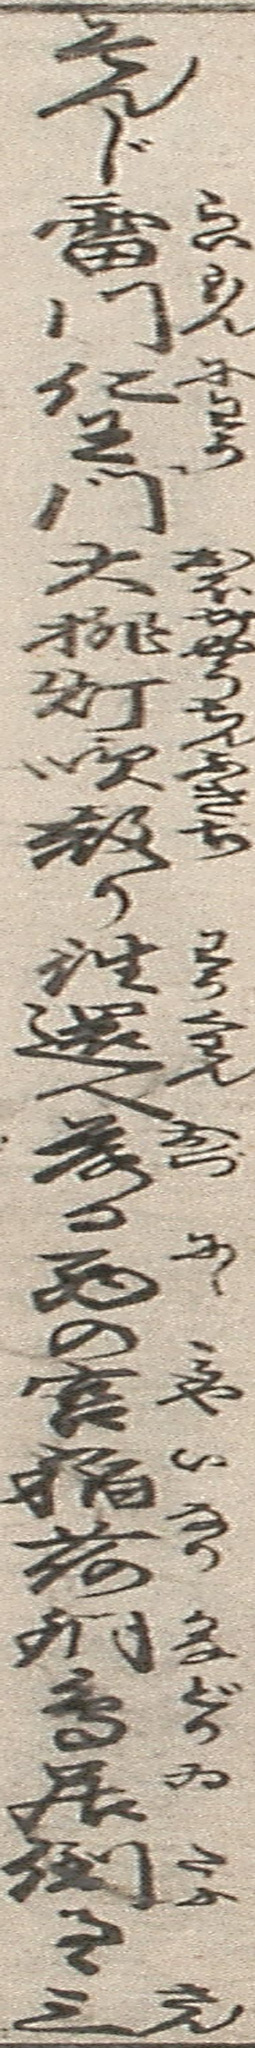そんじ雷門仁王門大挑灯吹散り往還へ落る西の宮稲荷銅鳥居倒るゝ三
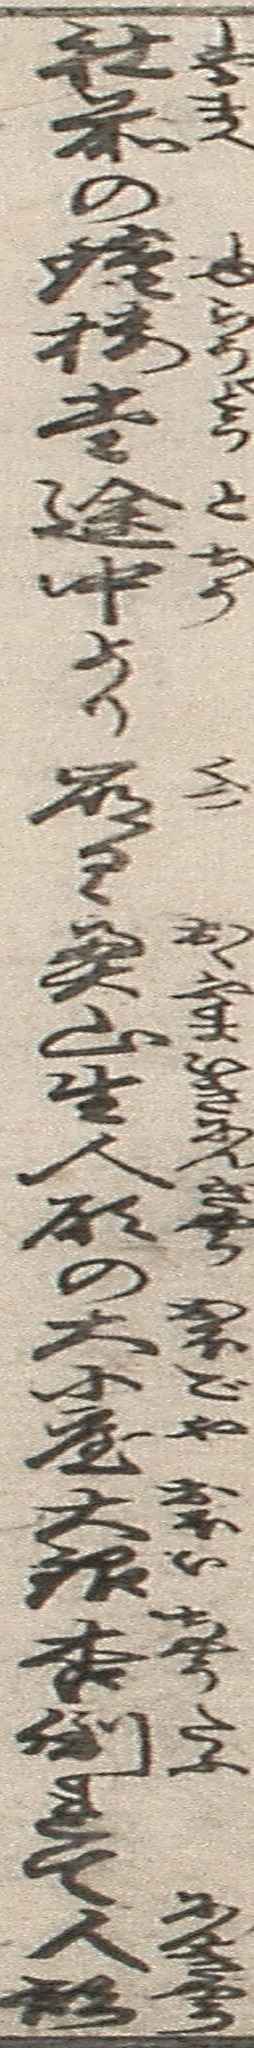社前の鐘楼堂途中より崩るゝ奥山生人形の大小家大銀杏倒れて人形
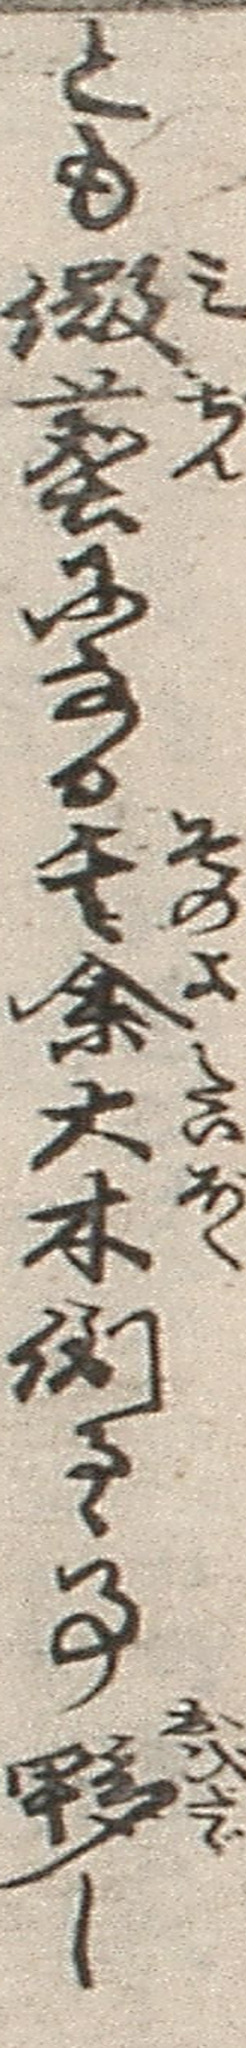とも微塵になる其余大木倒るゝ事夥し
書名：安政風聞集　上中下　全
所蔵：東京大学地震研究所図書室 Earthquake Research Institute Library, The University of Tokyo, JAPAN
